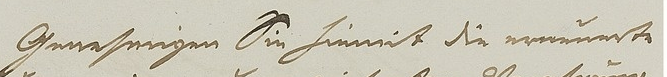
Genehmigen Sie hiemit die erneuerte
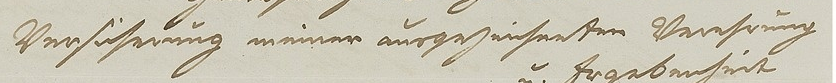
Versicherung meiner ausgezeichneten Verehrung
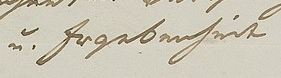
u. Ergebenheit
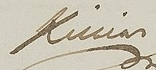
Killias
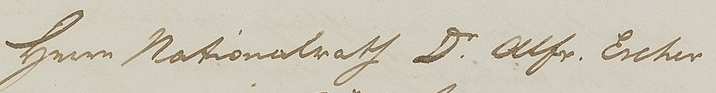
Herrn Nationalrath Dr Alfr. Escher
